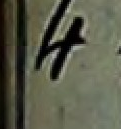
4
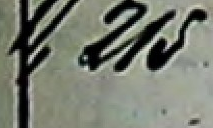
0,215
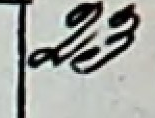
23
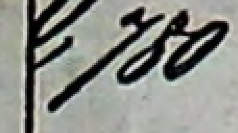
0,780
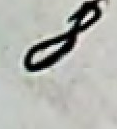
8
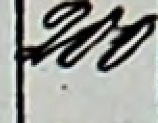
200
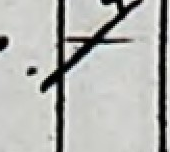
7
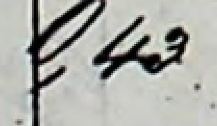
0,43
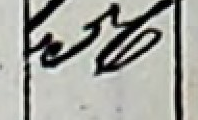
1,56
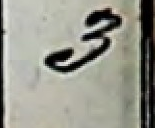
3
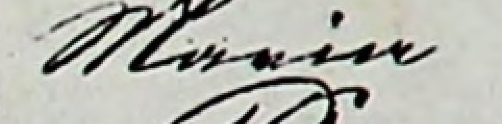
Maria
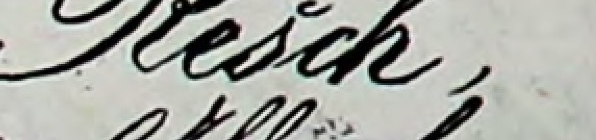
Resch,
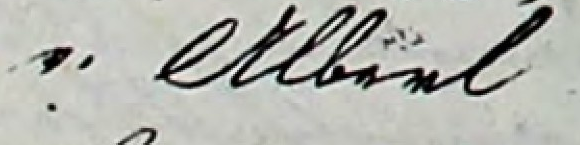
v. Alberl
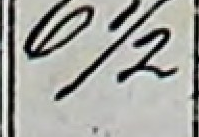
6 ½
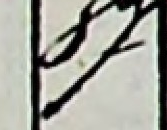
87
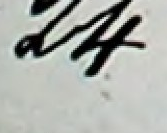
24
